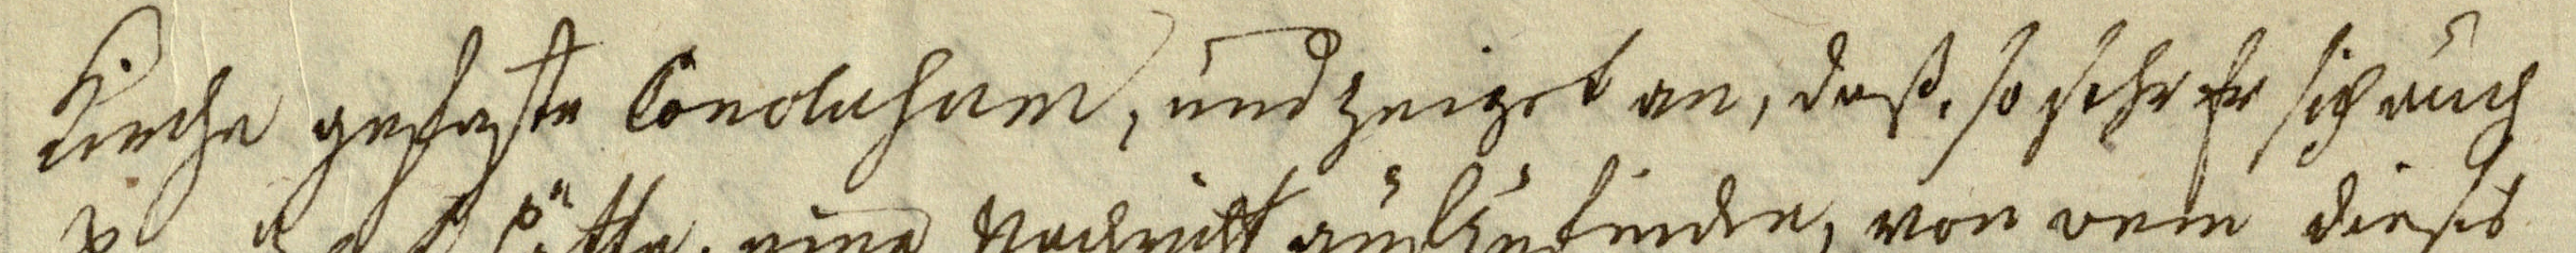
Kirche gefaßte Conclusum, und zeiget an, daß, so sehr Er sich auch
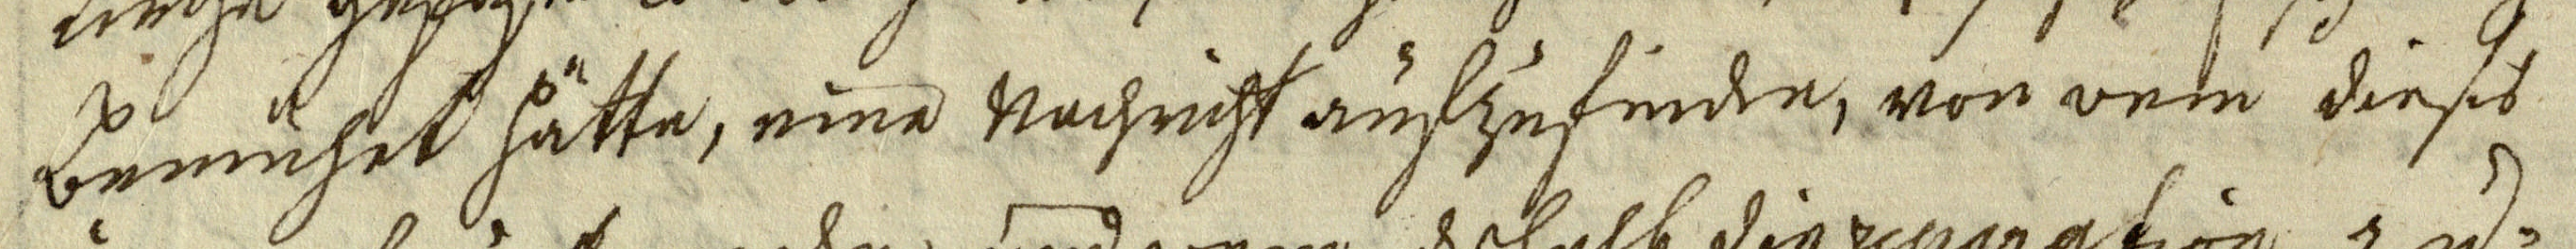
bemühet hätte, eine Nachricht aufzufinden, von wem dieses
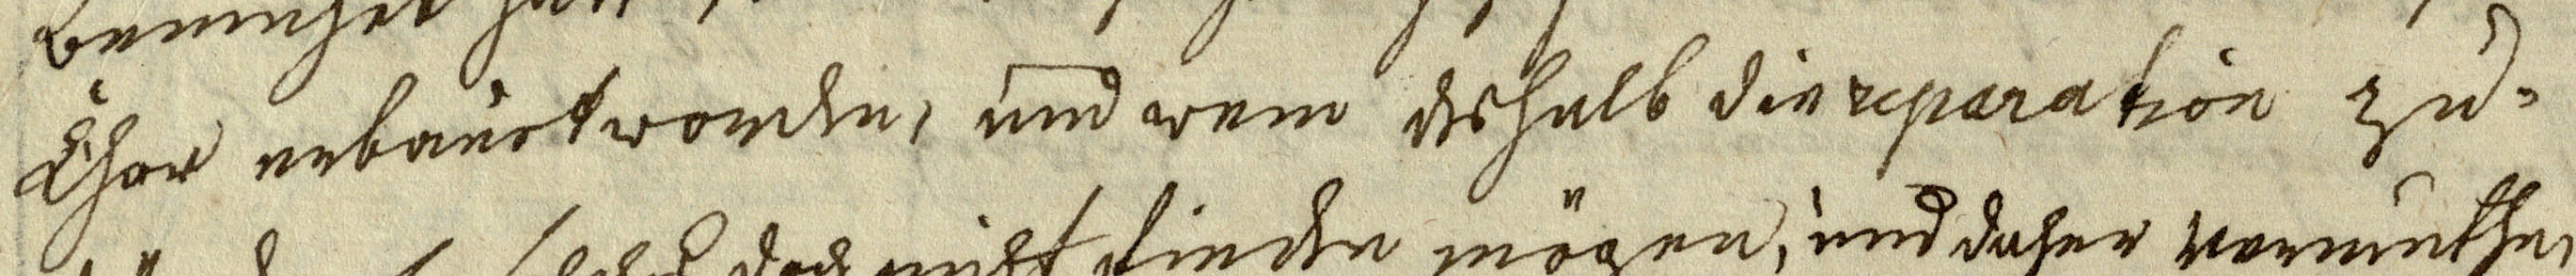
Chor erbauet worden, und wem deshalb die reparation zu¬
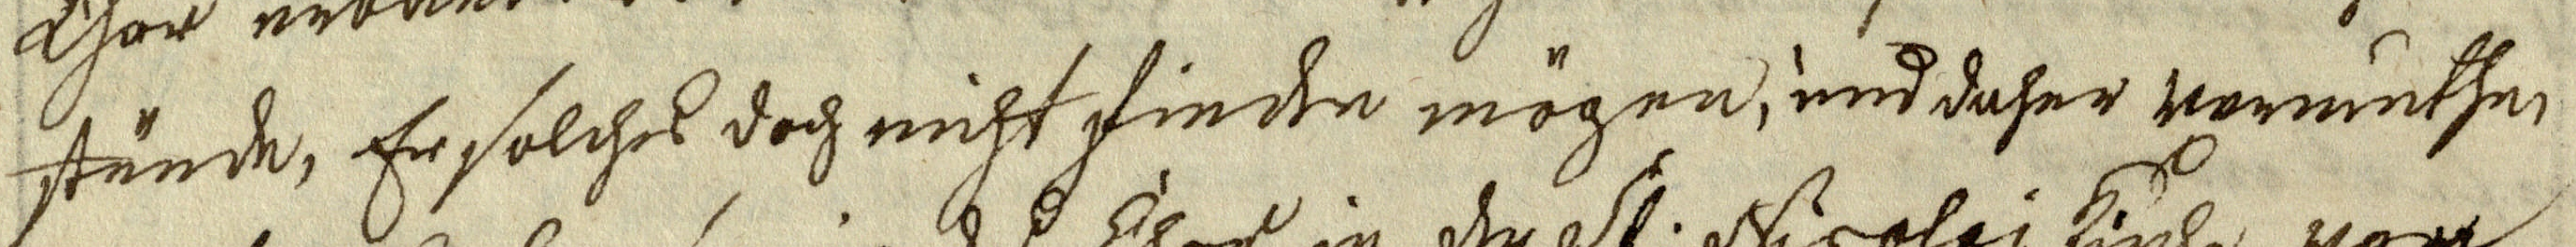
stünde, Er solches doch nicht finden mögen, und daher vermuthe,
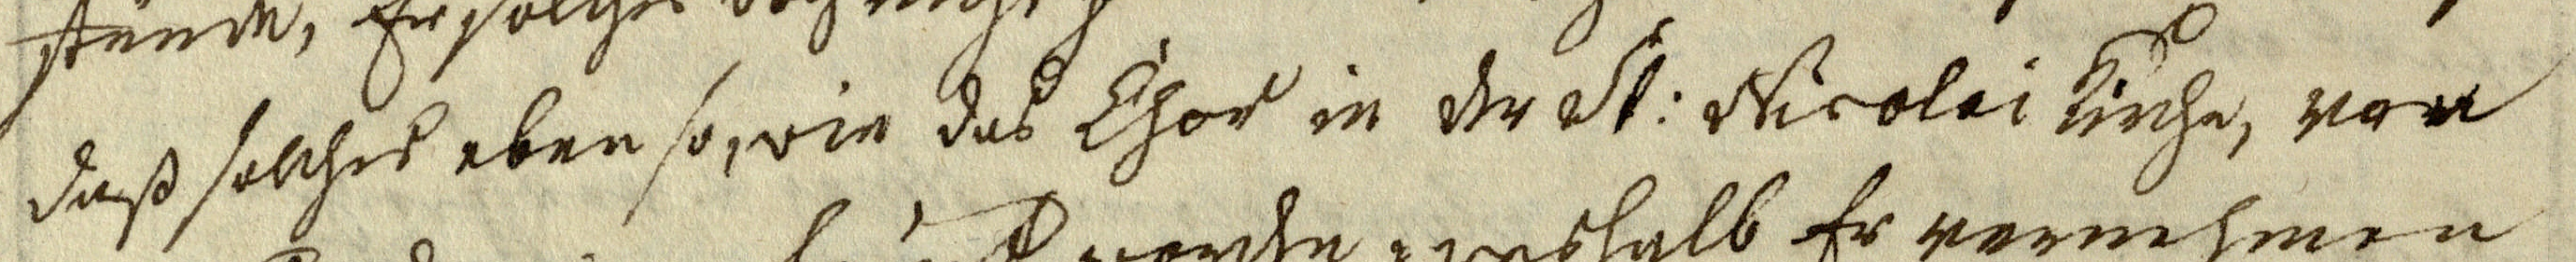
daß solches eben so, wie das Chor in der St. Nicolai Kirche, von
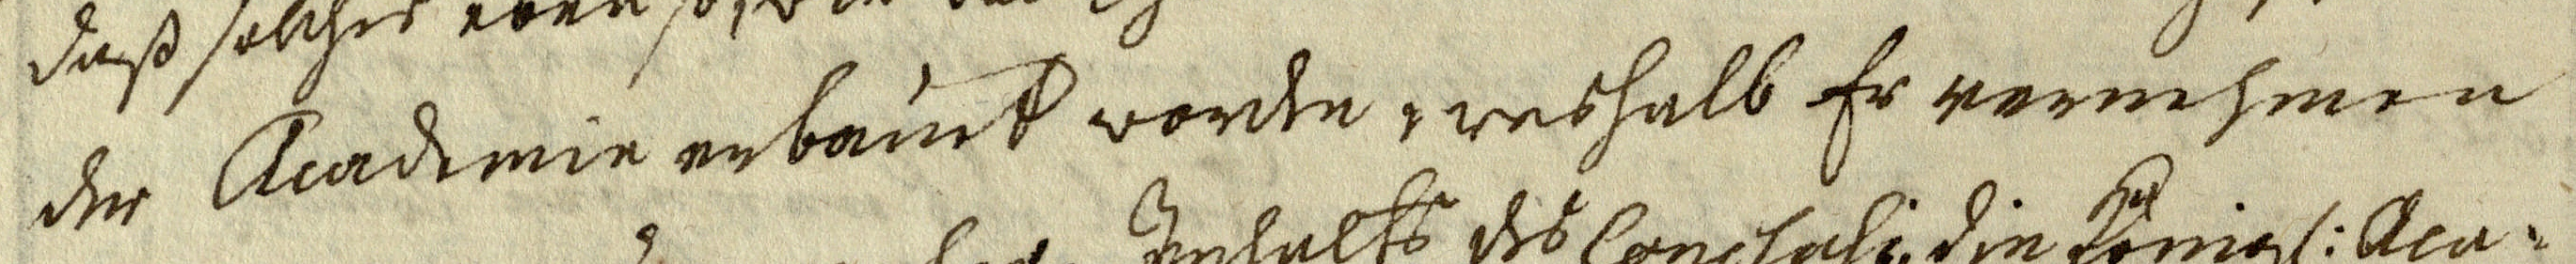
der Academie erbauet worden, weshalb Er vernehmen
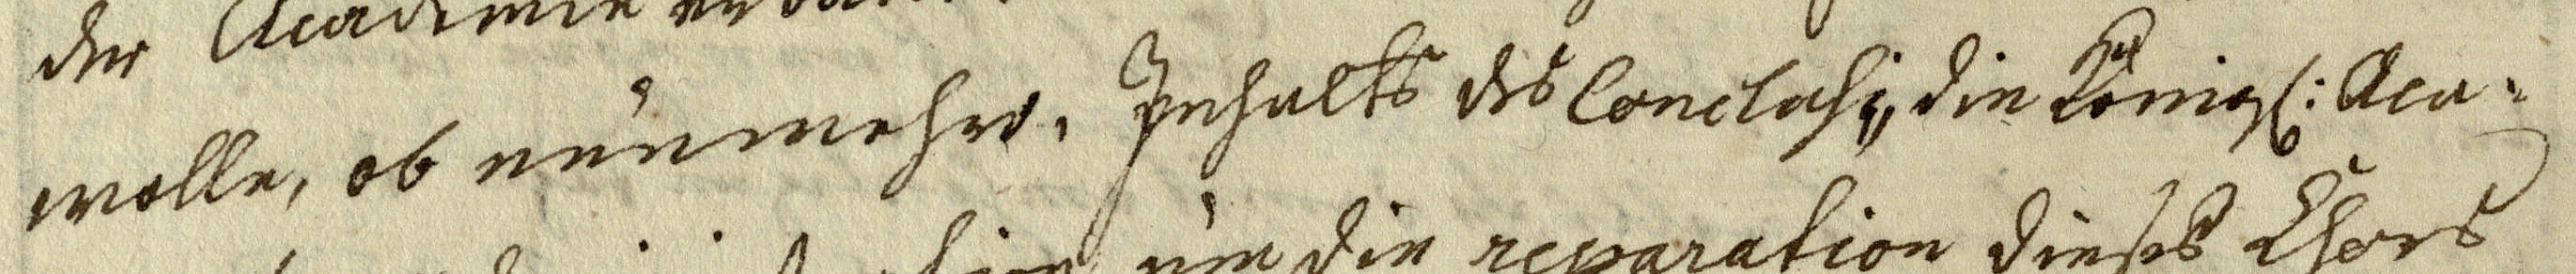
wolle, ob nunmehro Inhalts des Conclusii, die Königl. Aca¬
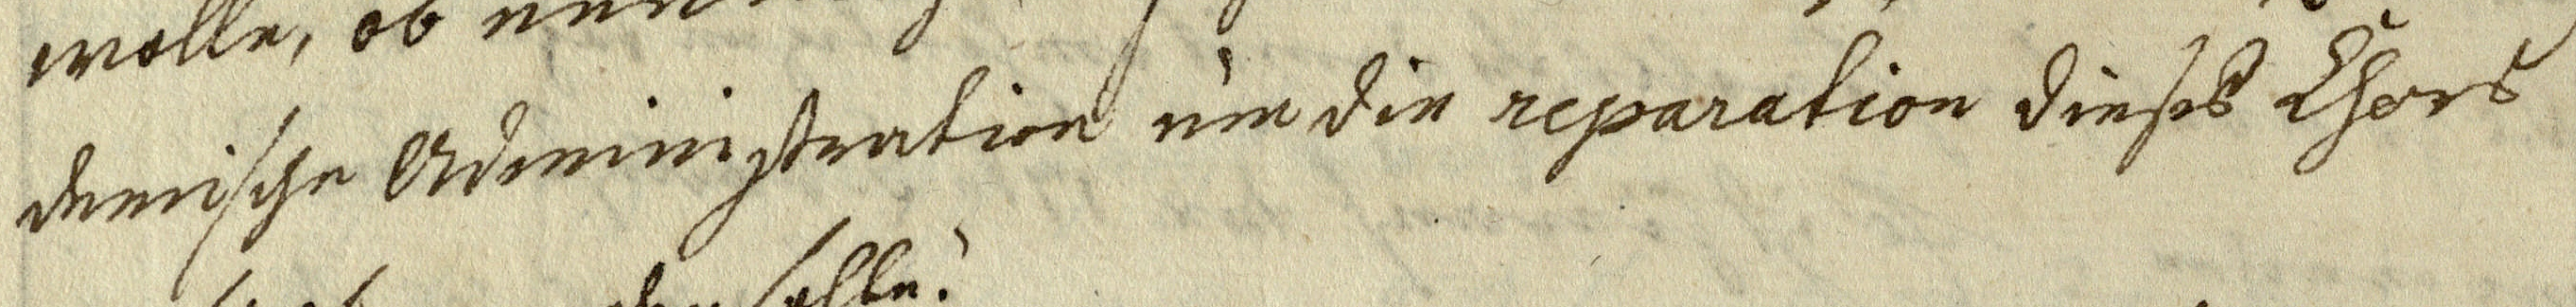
demische Administration um die reparation dieses Chors
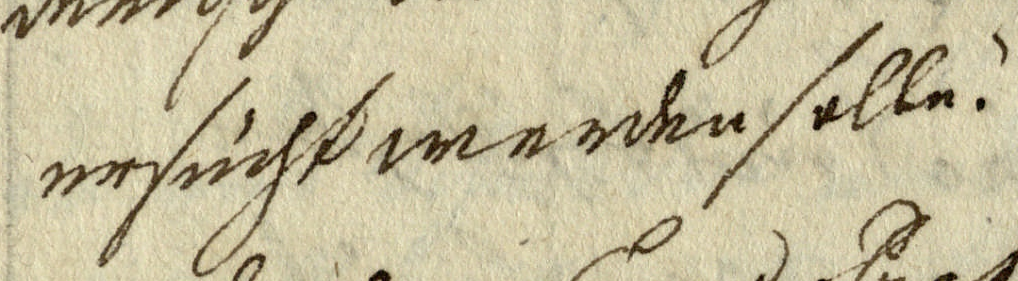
ersucht werden solle.
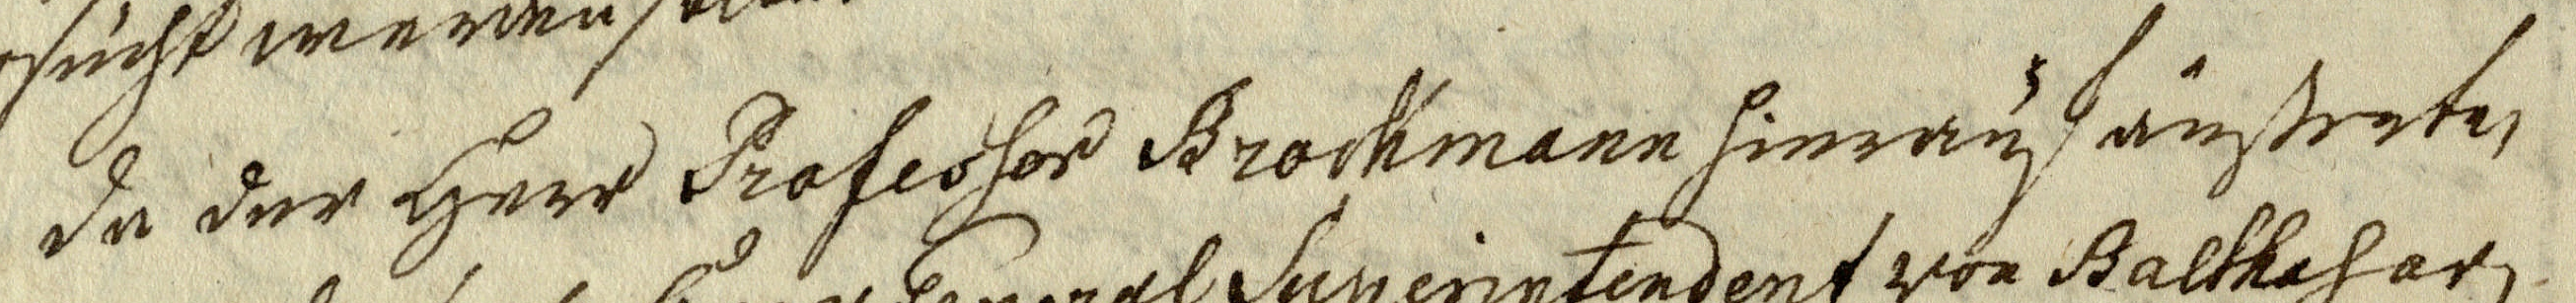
Da der Herr Professor Brockmann hierauf äußerte,
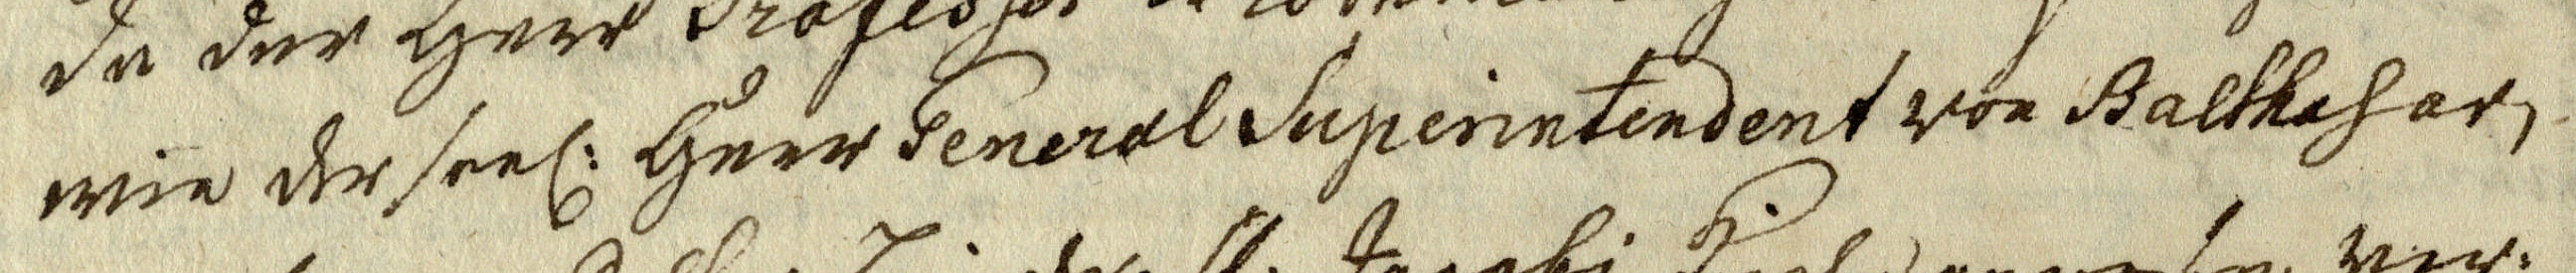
wie der seel. Herr General Superintendent von Balthasar,
